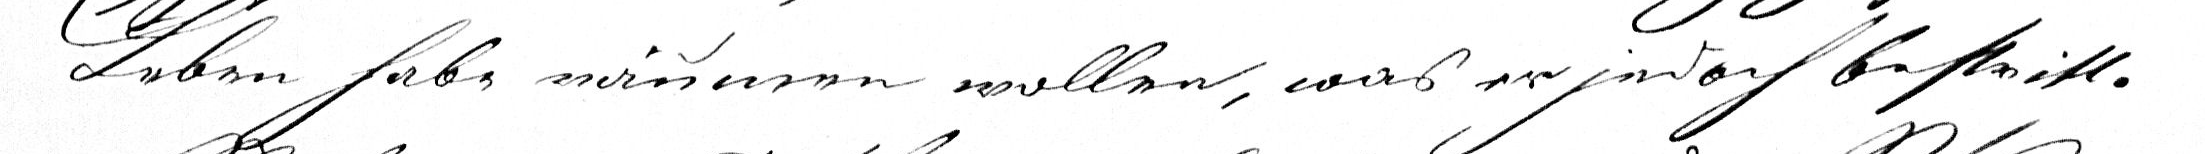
Leben habe räumen wollen, was er jedoch bestritt.
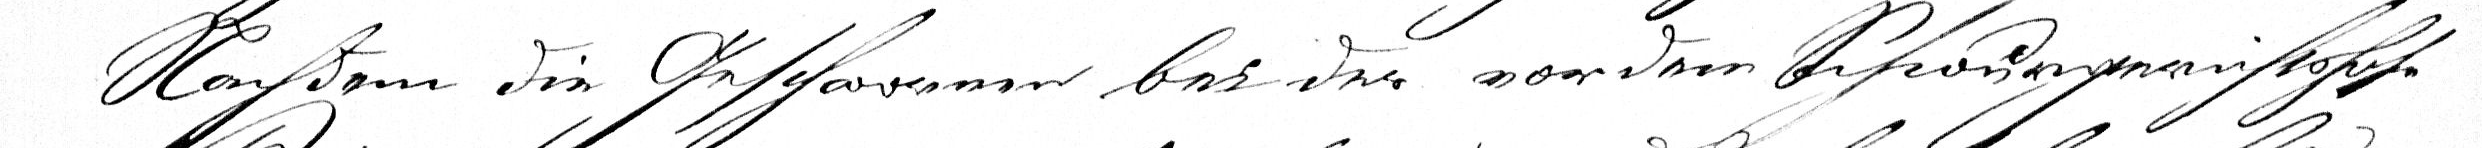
Nach dem die Geschwornen bei der vor dem Schwurgerichtshofe
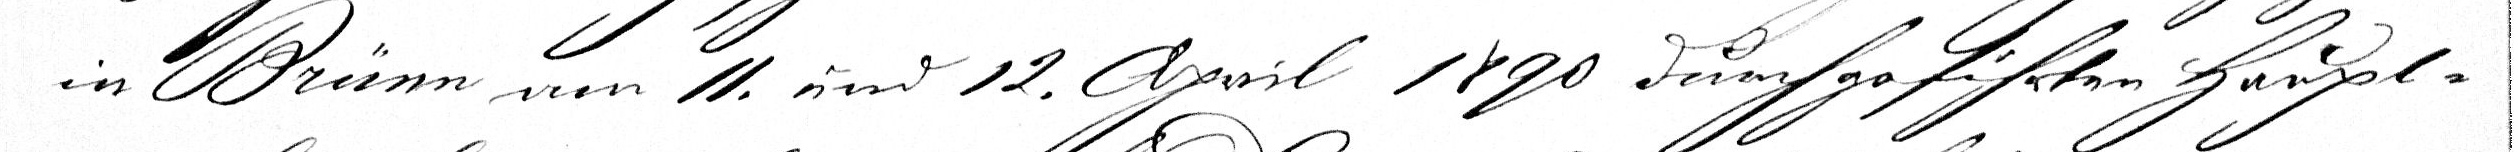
in Brünn am 11. und 12. April 1890 durchgeführten Haupt¬
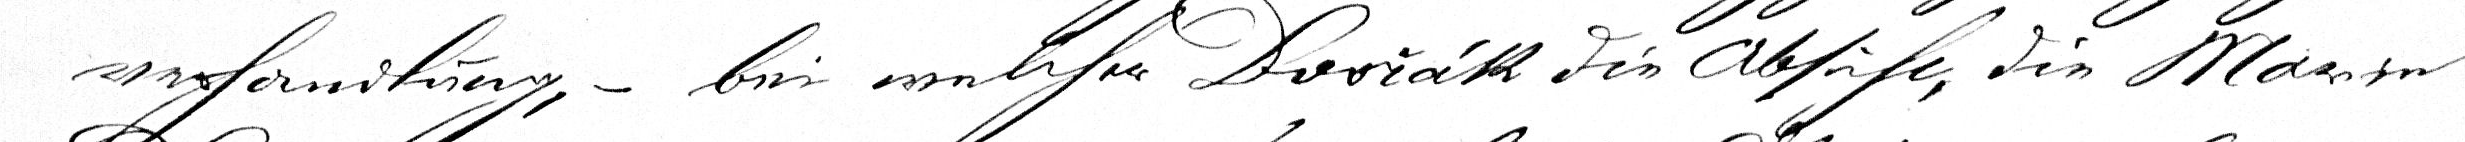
verhandlung,- bei welcher Dvořák die Absicht, die Marte
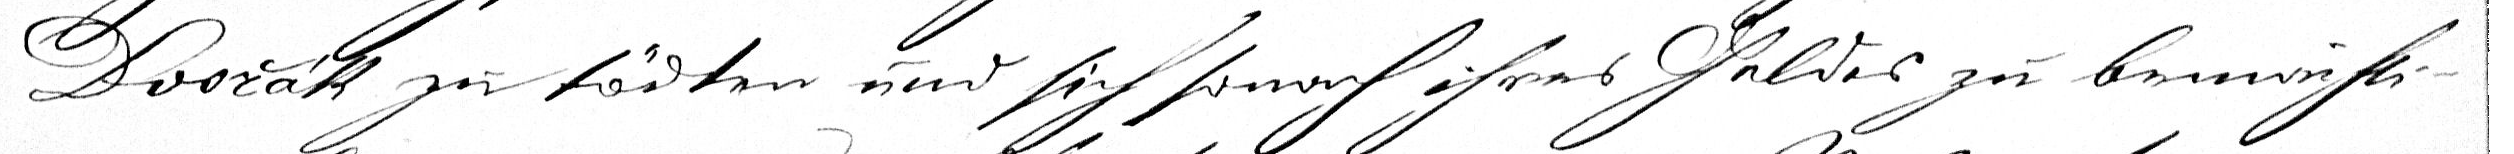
Dvořák zu tödten und sich sonach ihres Geldes zu bemrichli¬
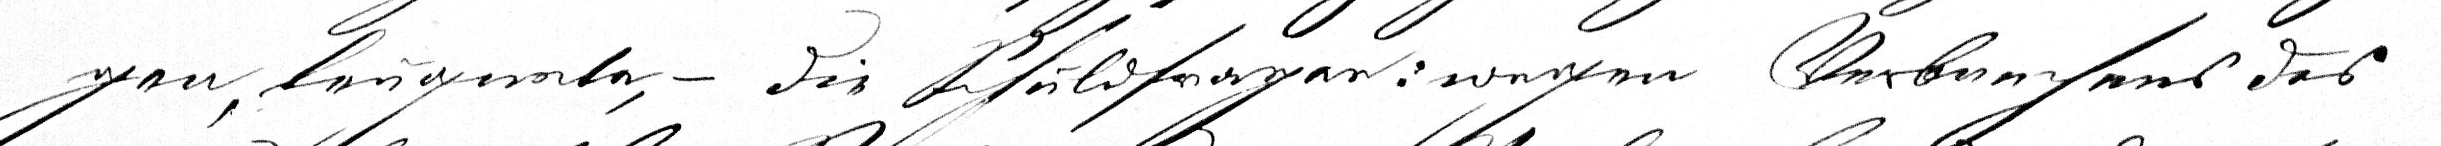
gen, leugnete,- die Schuldfragen: wegen Verbrechens des
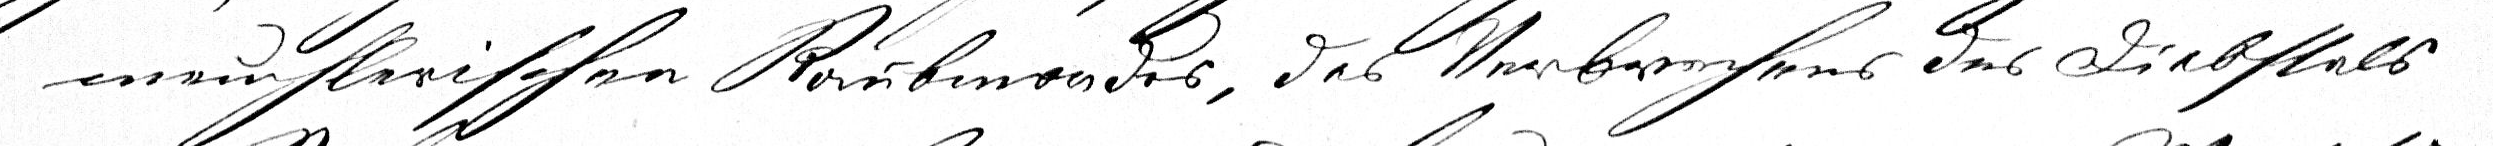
meuchlerischen Raubmordes, des Verbrechens des Diebstels
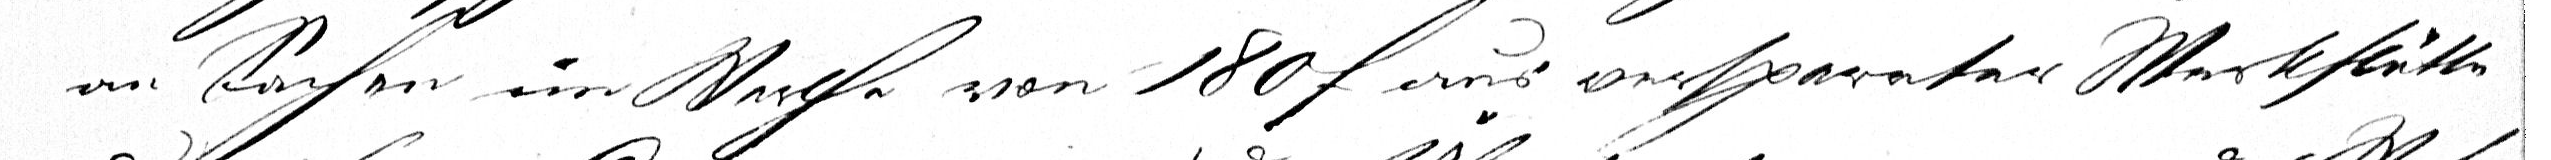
an Sachen ein Werthe von 180f aus versparater Werkflütte
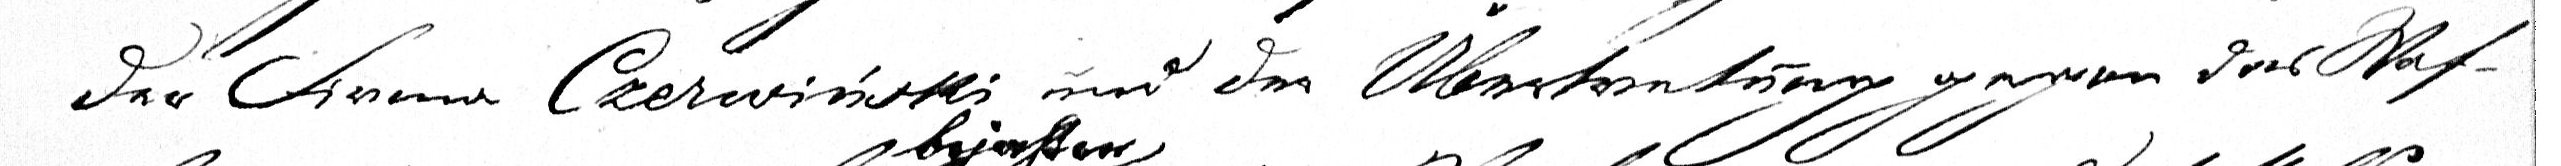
der Firma Czerwiéski und des Übertretung gegen des Waf¬
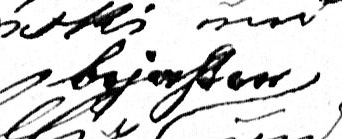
bejahten
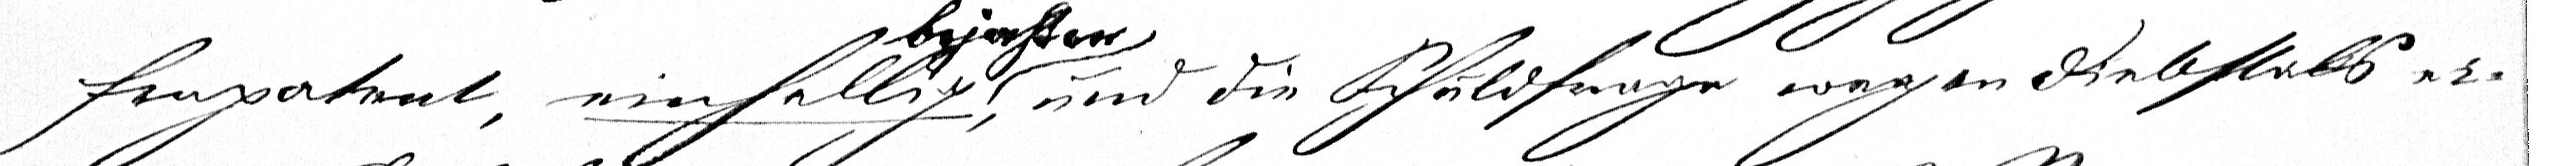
fenpatent, einhellig, und die Schuldfrege wegen Diebstals ei¬
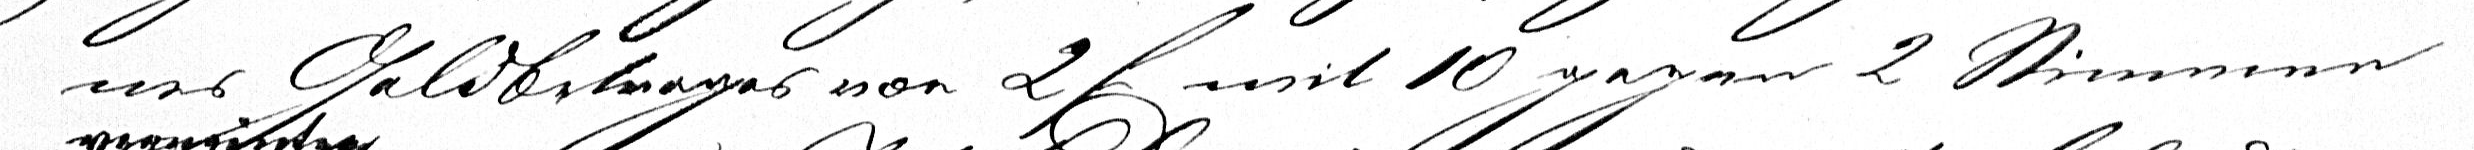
nes Geldbetrages von 2f mit 10 gegen 2 Stimmen
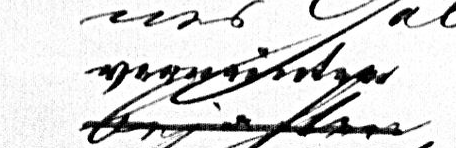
vereinten,
